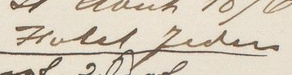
Hotel Feder.
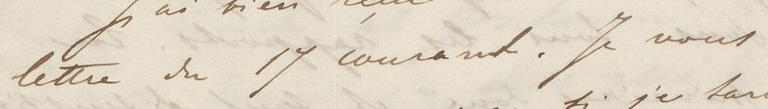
lettre du 17 courant. Je vous
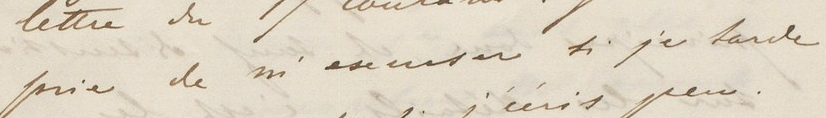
prie de m'excuser si je tarde
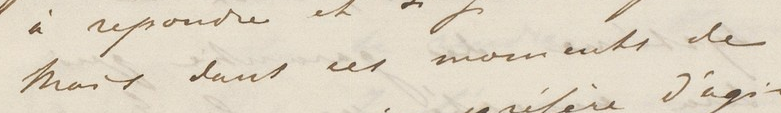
Mais dans ces moments de
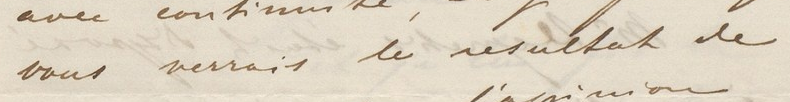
vous verrais le resultat de
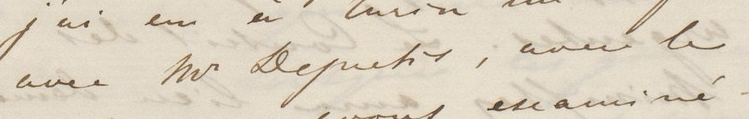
avec MrDepretis, avec le
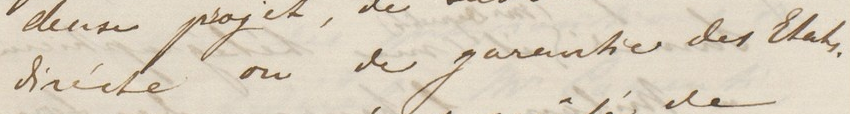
dirécte ou de garantie des États.
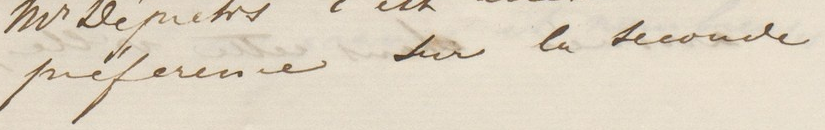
préference sur la seconde
